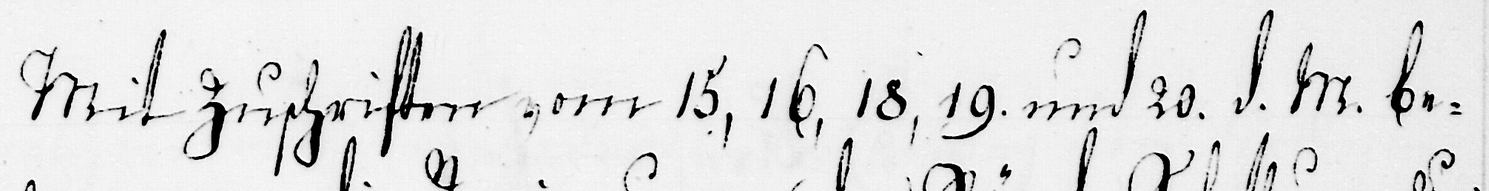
Mit Zuschriften vom 15, 16, 18, 19. und 20. d. M. bes¬
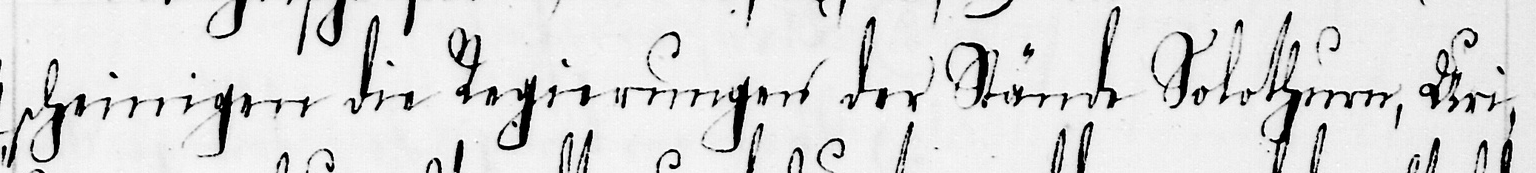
cheinigen die Regierungen der Stände Solothurn, Uri,
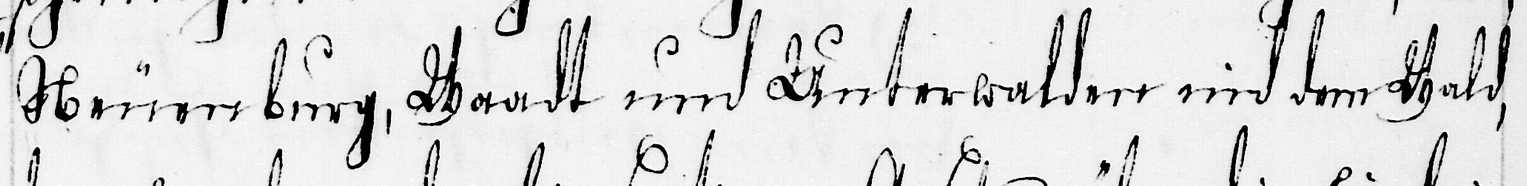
Neuenburg, Waadt und Unterwalden nid dem Wald,
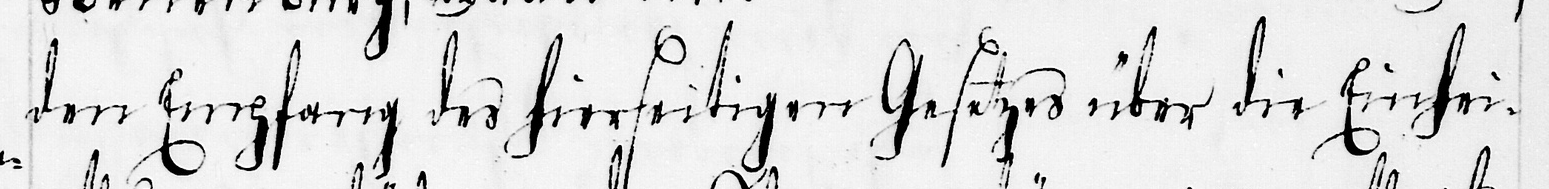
den Empfang des hierseitigen Gesetzes über die Einhei¬
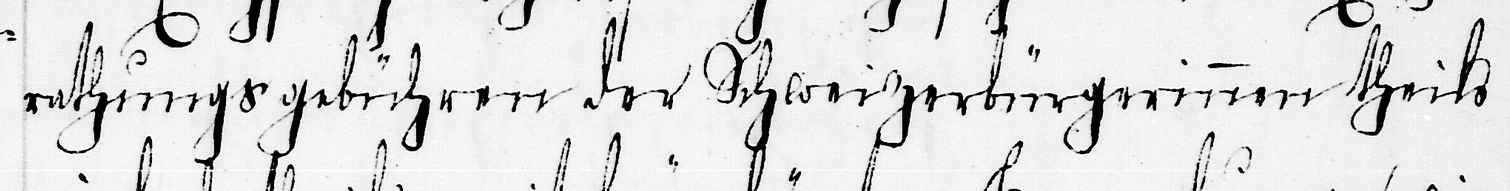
rathungsgebühren der Schweizerbürgerinnen theils
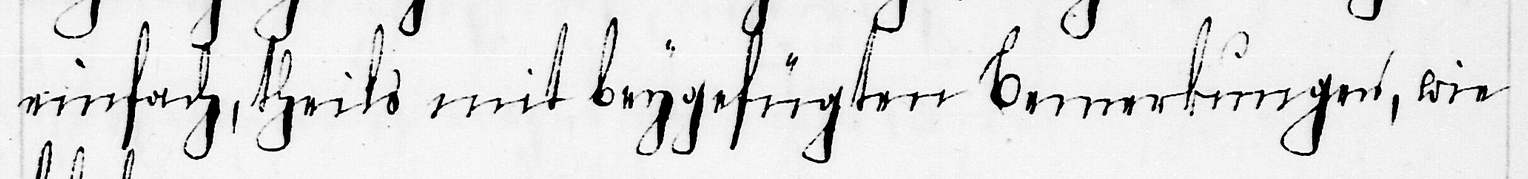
einfach, theils mit beygefügten Bemerkungen, wie
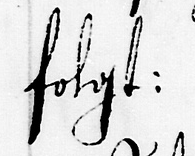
folgt:
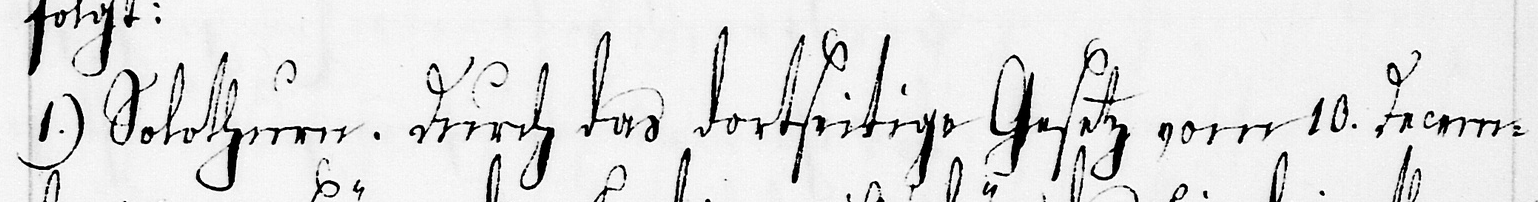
1.) Solothurn. Durch das dortseitige Gesetz vom 10. Decem¬
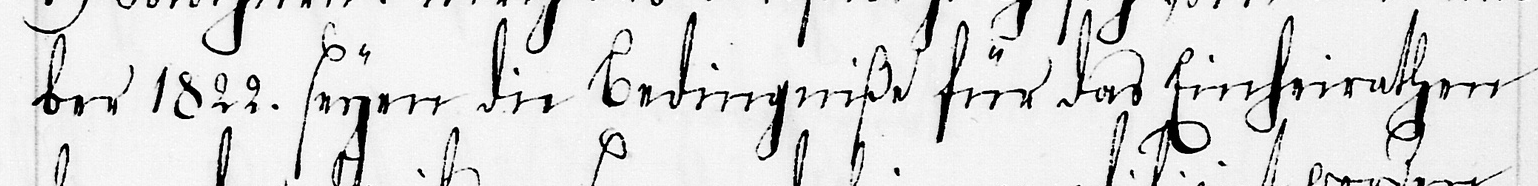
ber 1822. seyen die Bedingniße für das Einheirathen
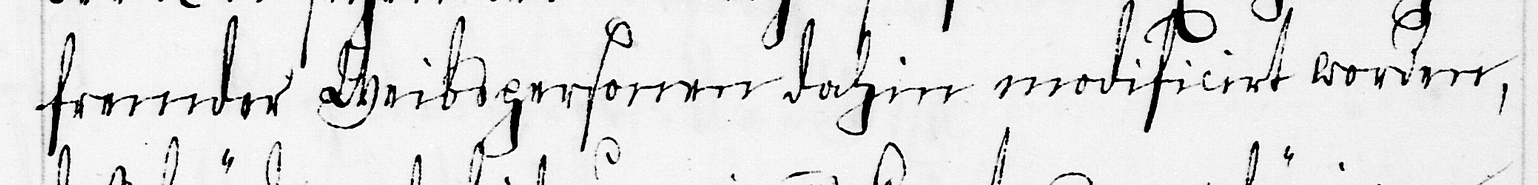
fremder Weibspersonen dahin modificirt worden,
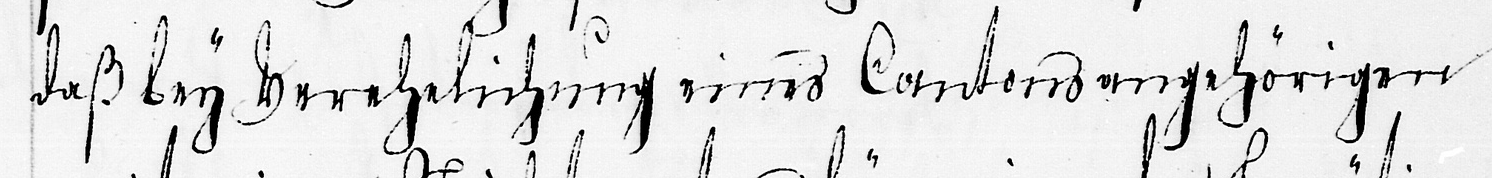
daß bey Verehelichung eines Cantonsangehörigen
